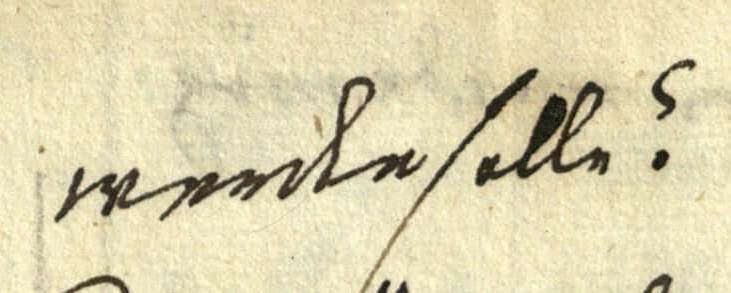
werden solle?
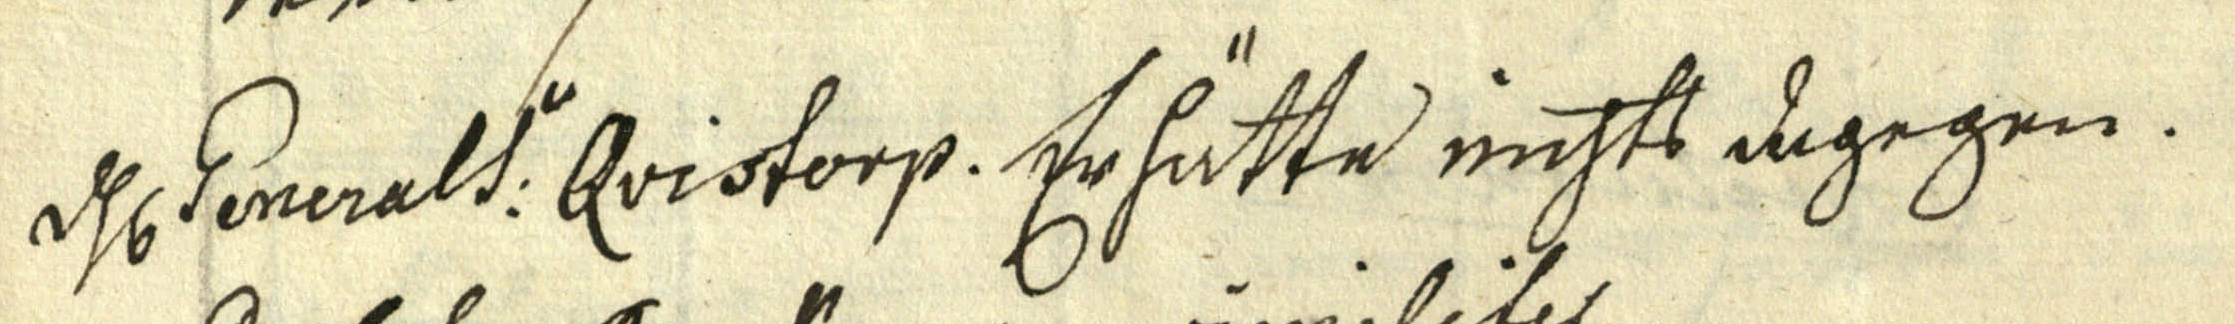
dh GeneralS. Quistorp. Er hätte nichts dagegen.
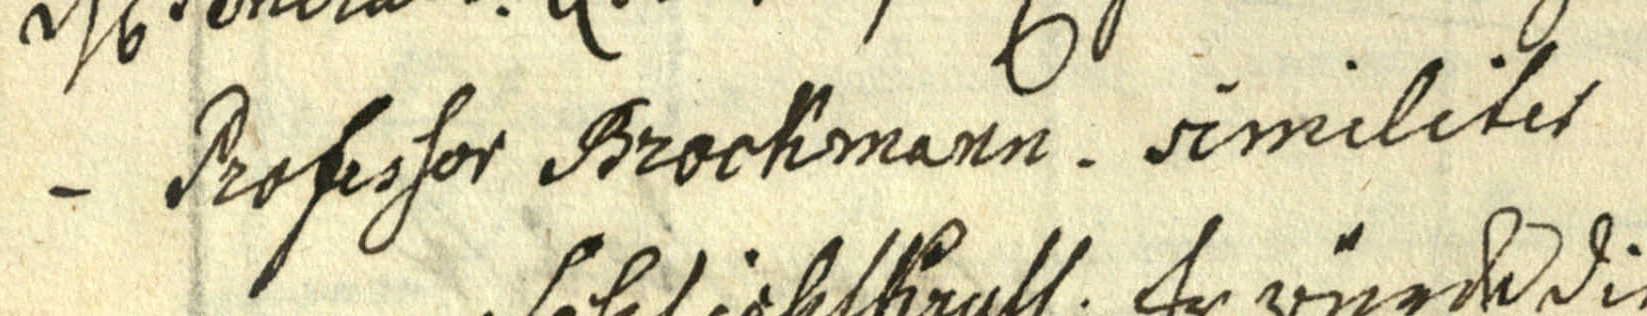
Professor Brockmann. similiter
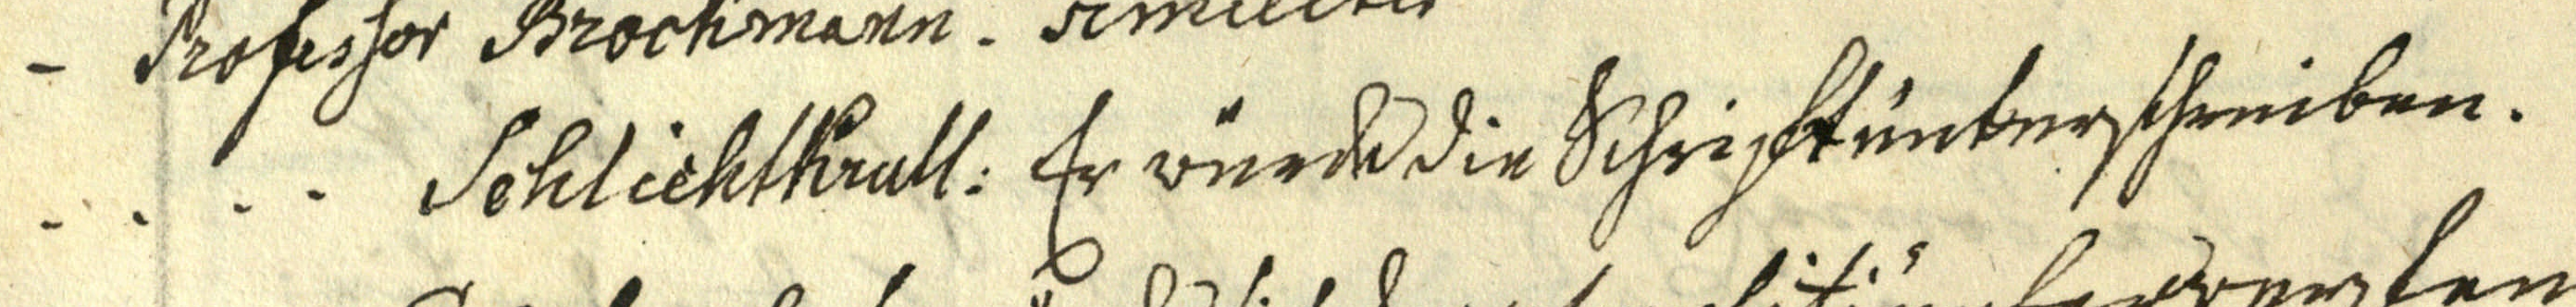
Schlichtkrull. Er würde die Schrift unterschreiben.
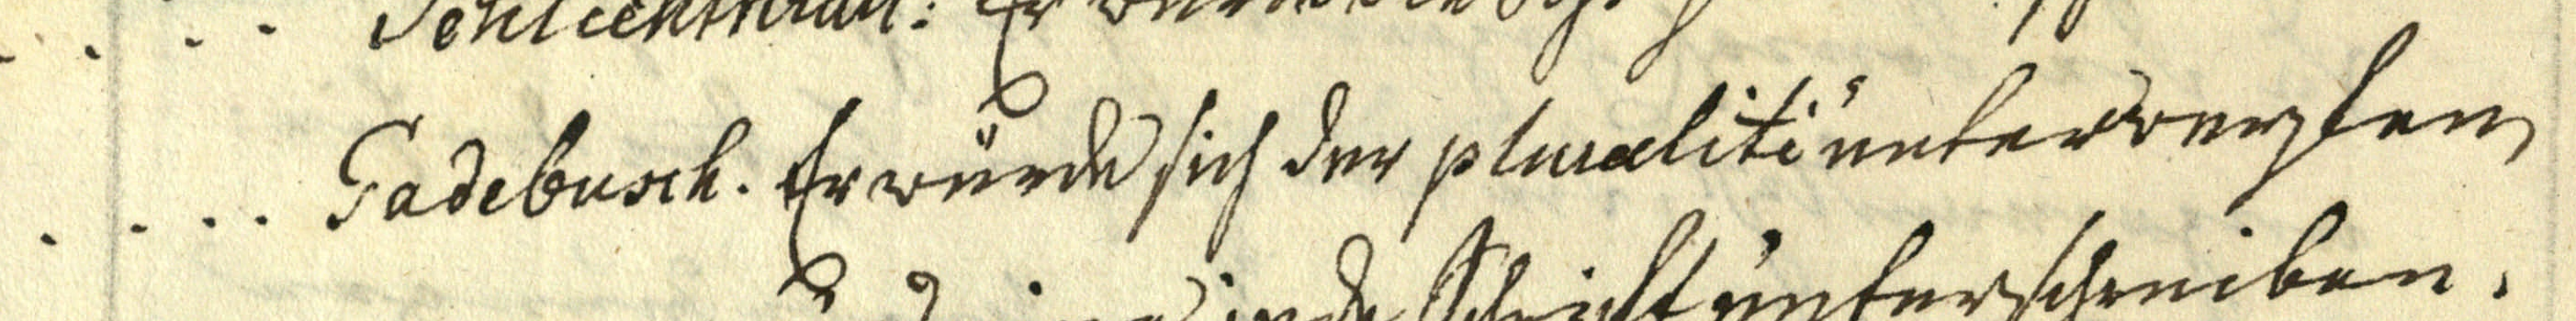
Gadebusch. Er würde sich der pluraliti unterwerfen,
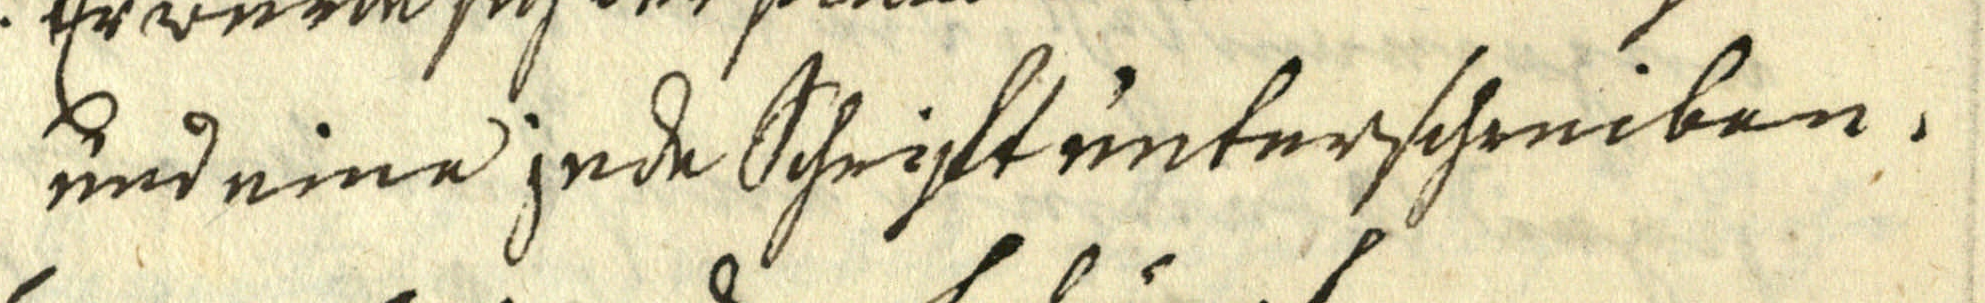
und eine jede Schrift unterschreiben.
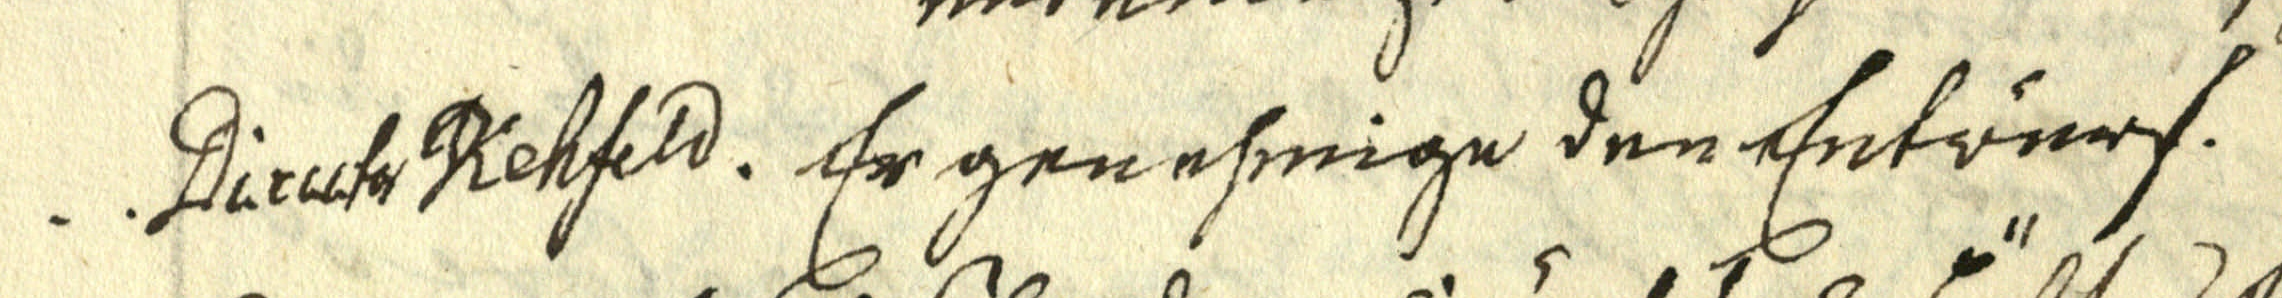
Director Rehfeld. Er genehmige den Entwurf.
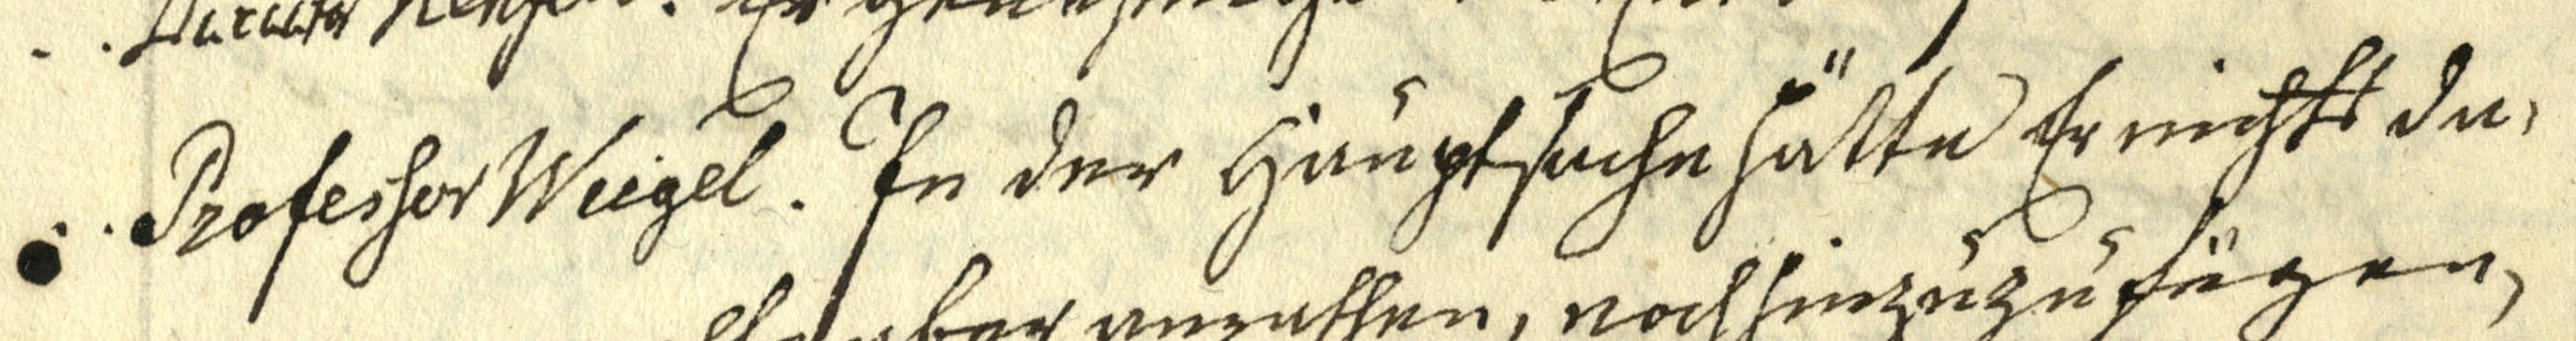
Professor Weigel. In der Hauptsache hätte Er nichts da¬
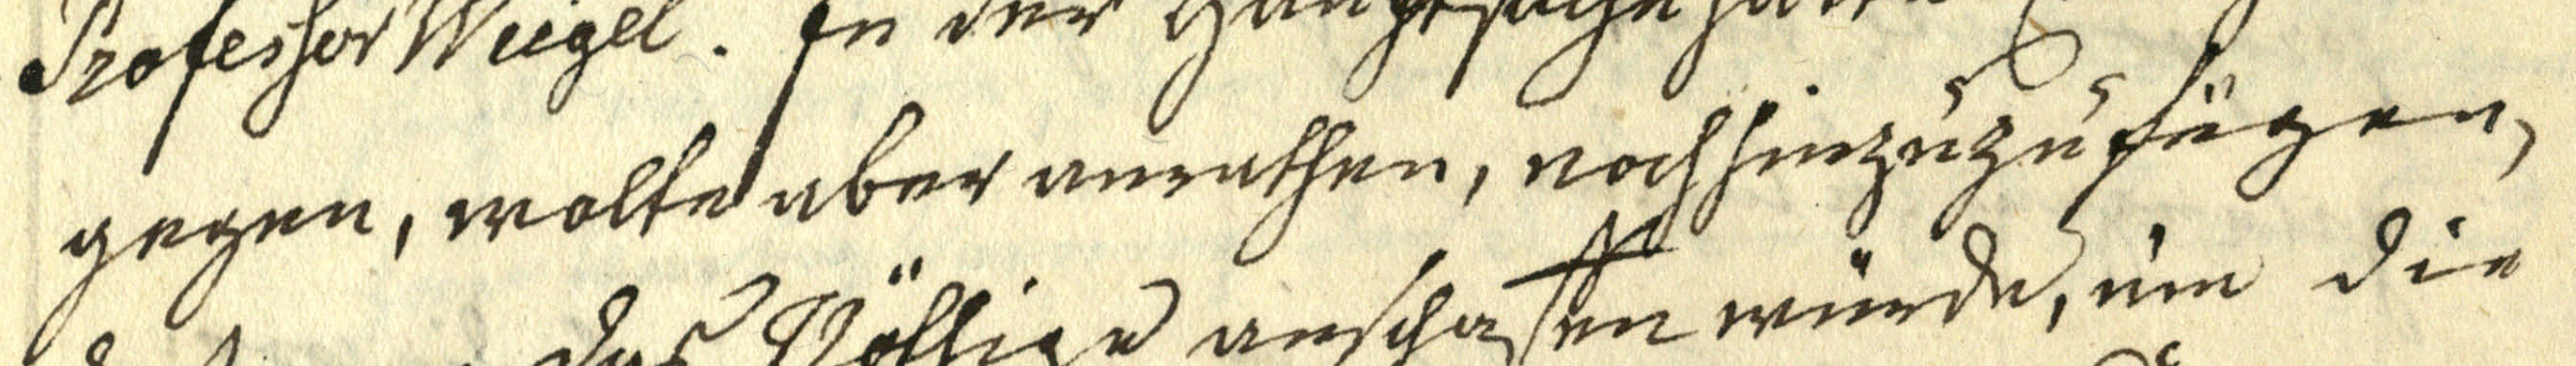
gegen, wolte aber anrathen, noch hinzuzufügen,
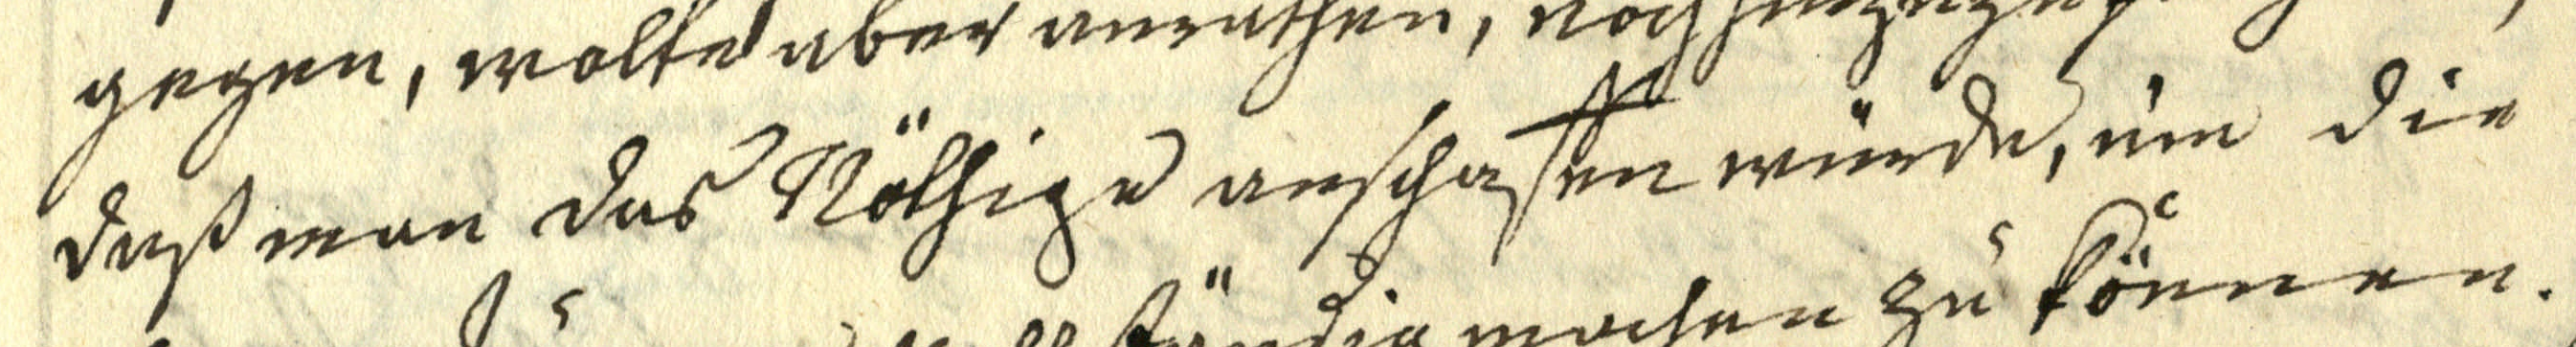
daß man das Nöthige anschaffen würde, um die
